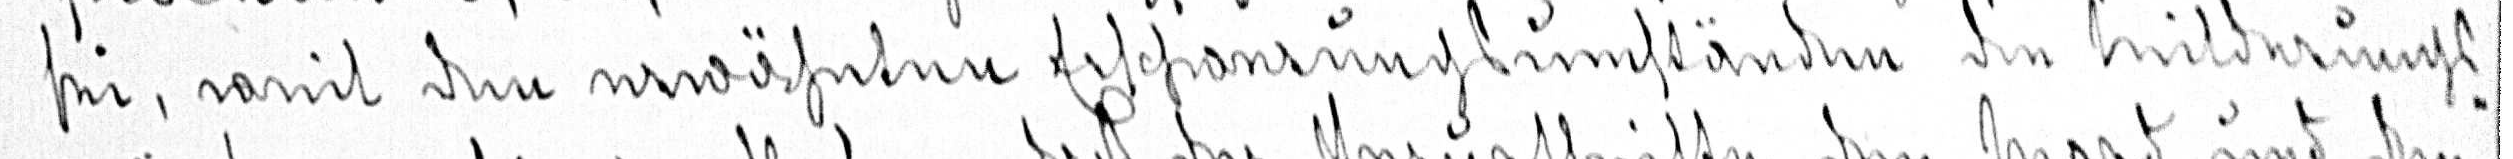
sei, weil den erwähnten Erschwerungsumständen die Milderungs¬
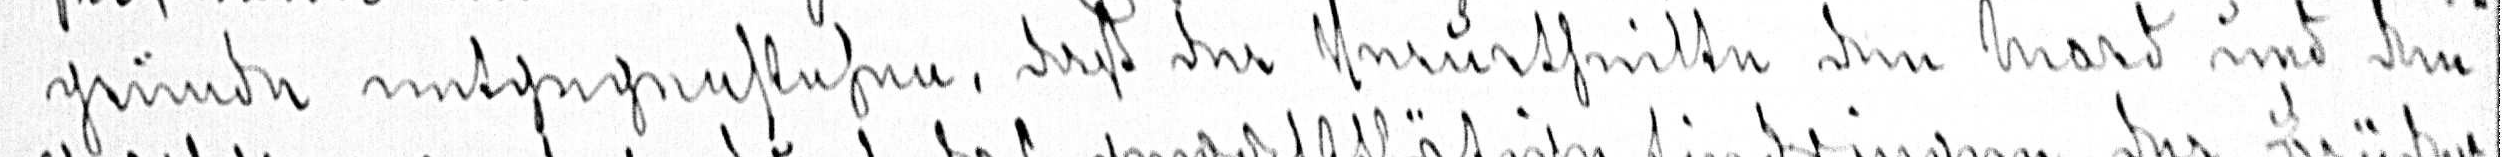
gründe entgegenstehen, daß der Verurtheilte den Mord und den
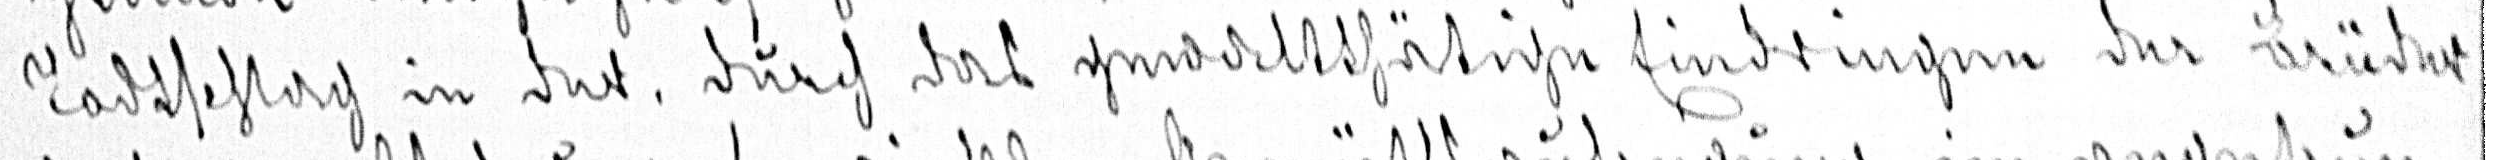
Todtschlag in der, durch das gewaltthätige Eindringen der Brüder
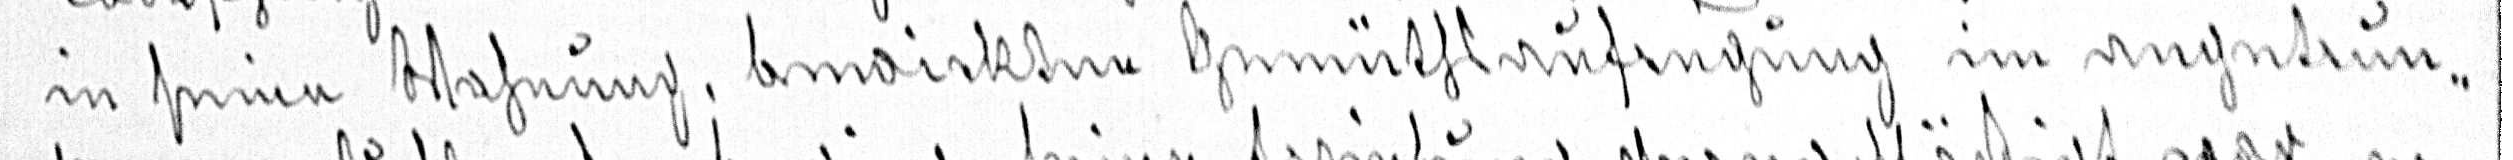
in seine Wohnung, bewirkten Gemüthsaufregung im angetrun¬
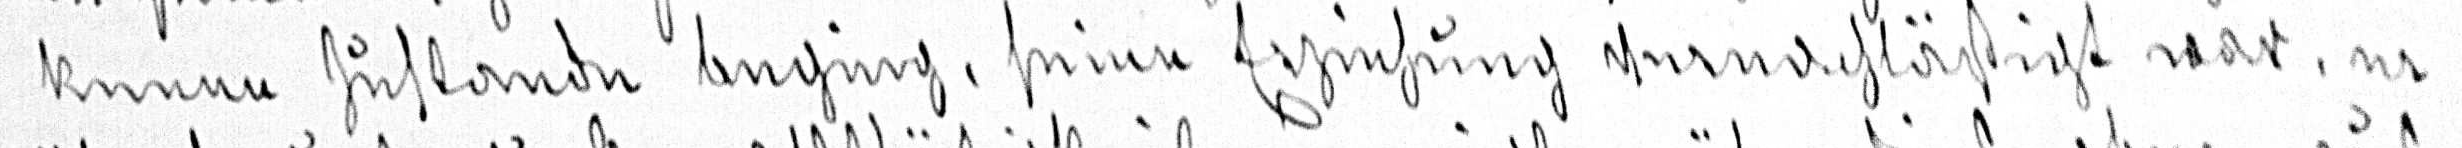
kenen Zustande beging, seine Erziehung vernachläßigt war, er
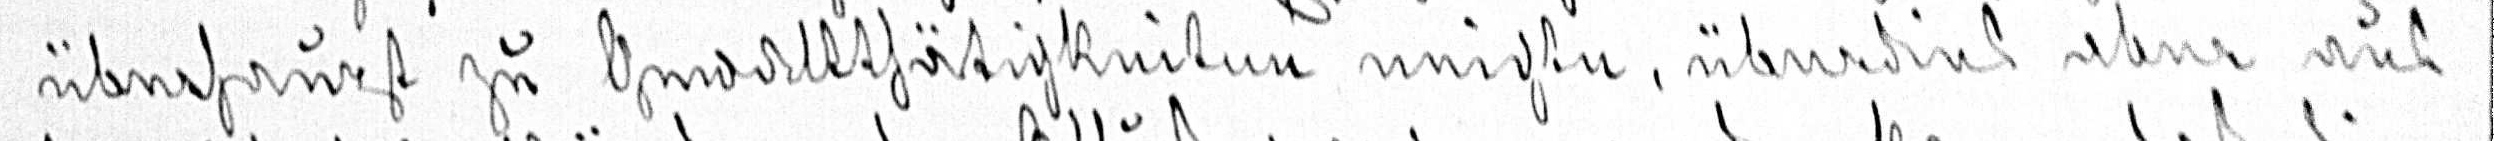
überhaupt zu Gewaltthätigkeiten neigte, überdies aber aus
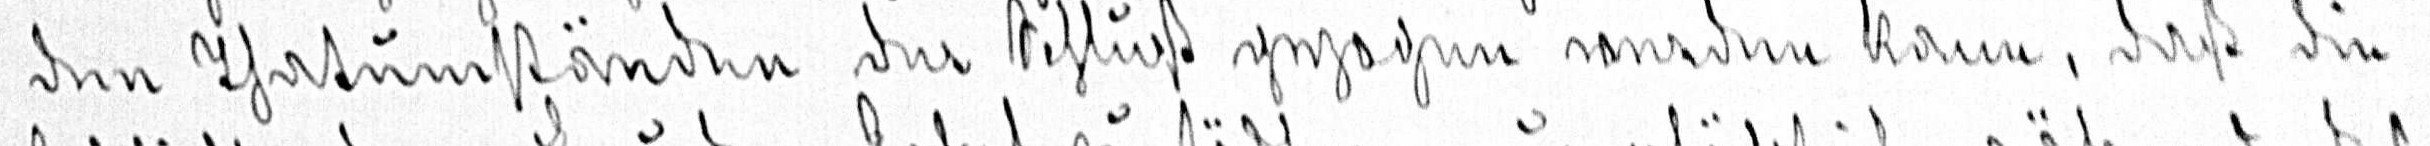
den Thatumständen der Schluß gezogen werden kann, daß die
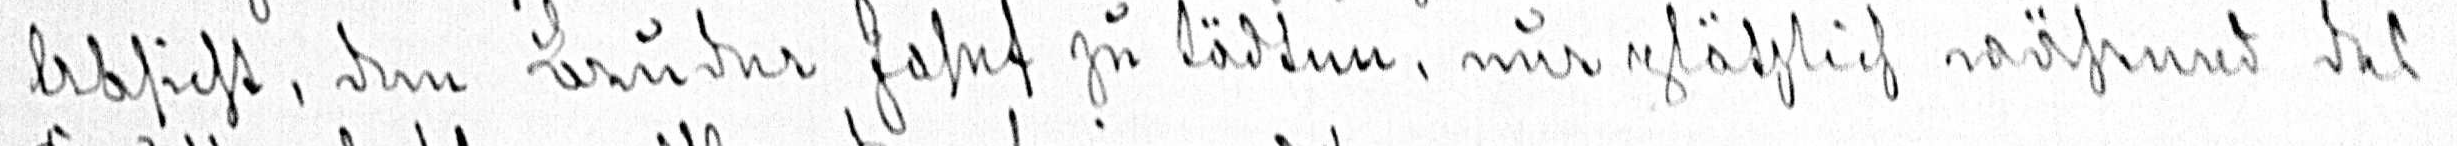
Absicht, den Bruder Josef zu tödten, nur plötzlich während des
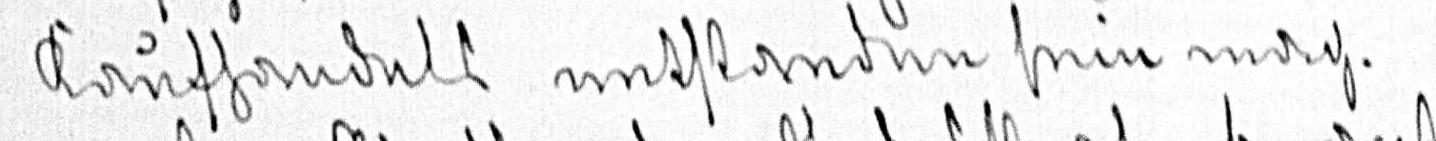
Raufhandels entstanden sein mag.
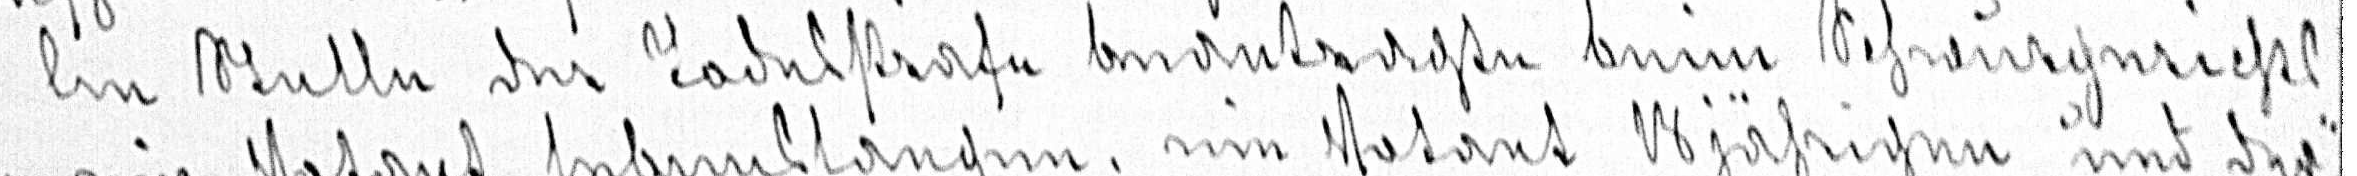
An Stelle der Todesstrafe beantragte beim Schwurgerichts¬
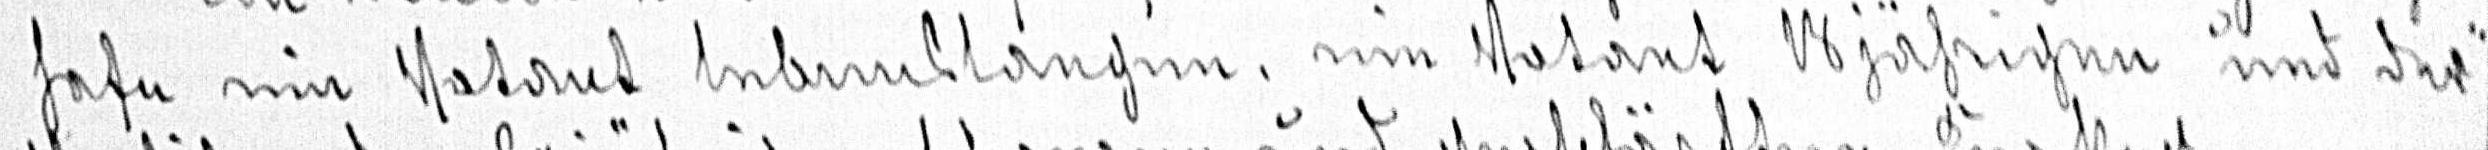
hofe ein Votant lebenslangen, ein Votant 18jährigen und der
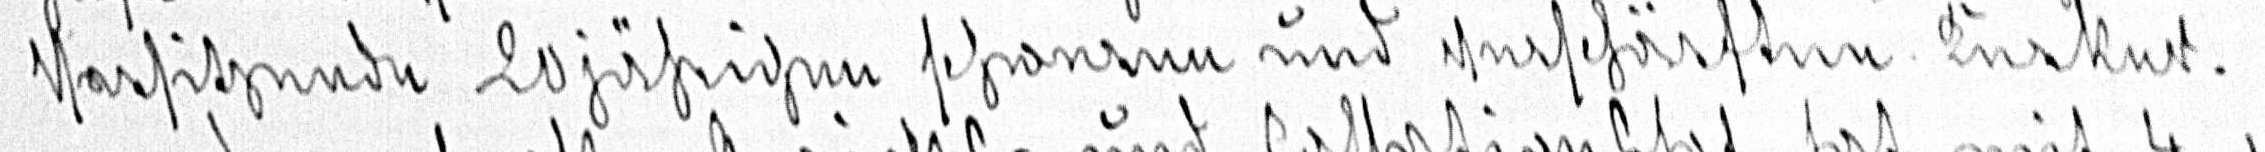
Vorsitzende 20jährigen schweren und verschärften Kerker.
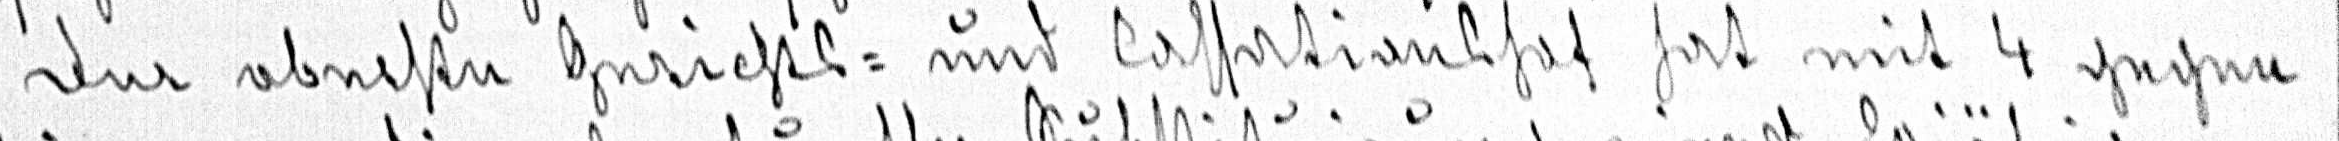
Der oberste Gerichts- und Cassationhof hat mit 4 gegen
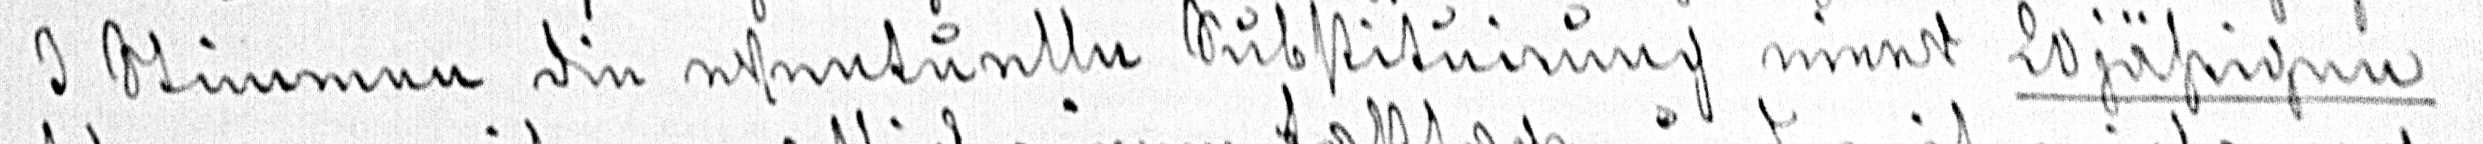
3 Stimmen die eventuelle Substituirung einer 20jährigen
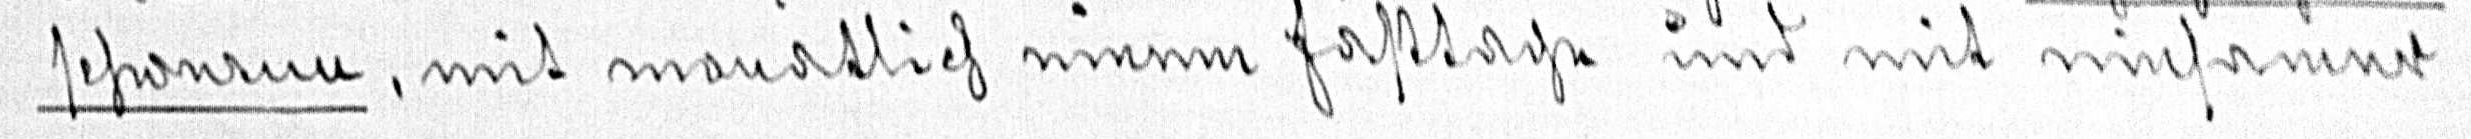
schweren, mit monatlich einem Fasttage und mit einsamer
